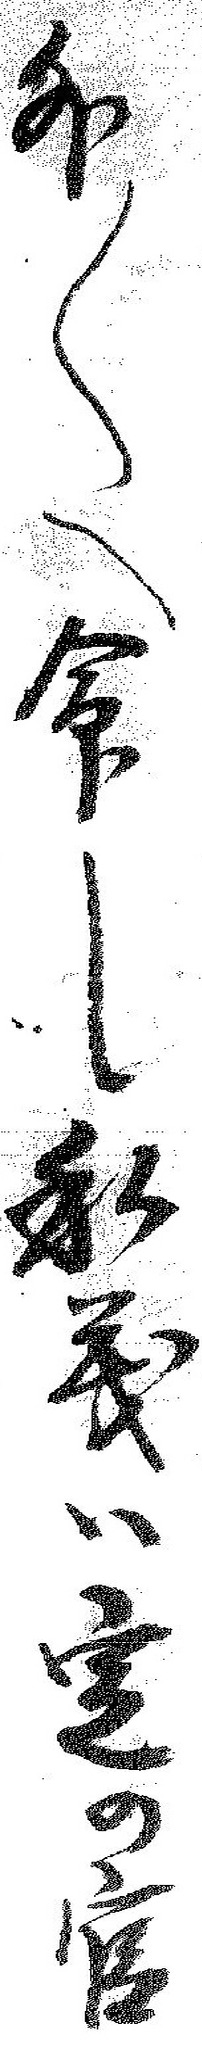外〳〵へ命し私義は定の官
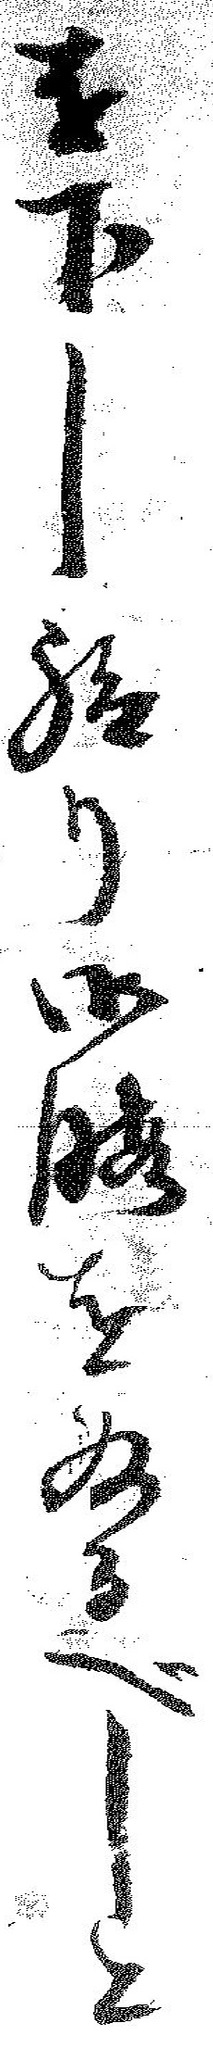を下し給り御暇を給るべしと
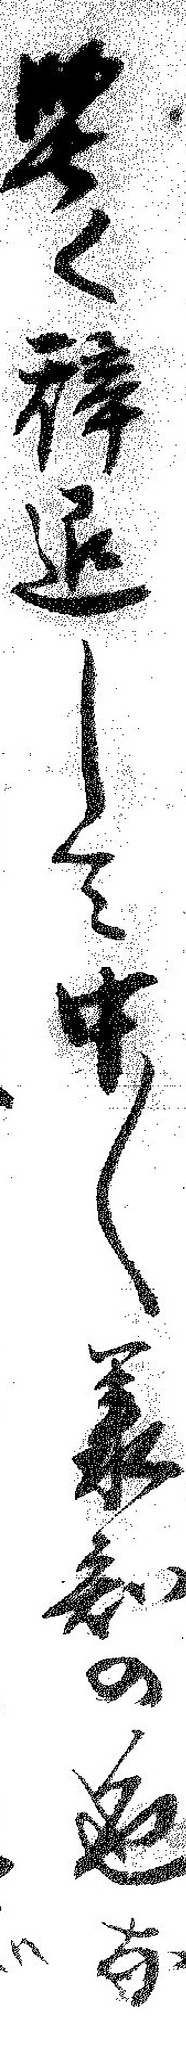堅く辞退して中〳〵承知の色な
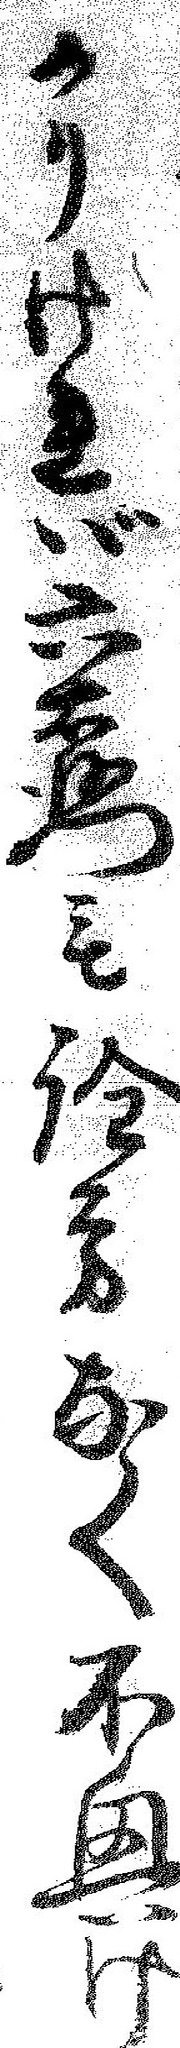かりければ六右衛門も詮方なく不興げ
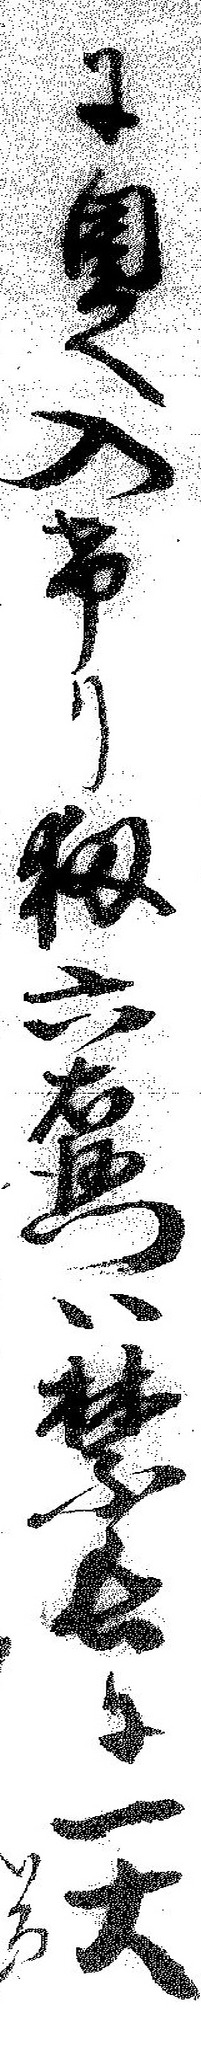に奥へ入けり扨六右衛門は禁長に一大
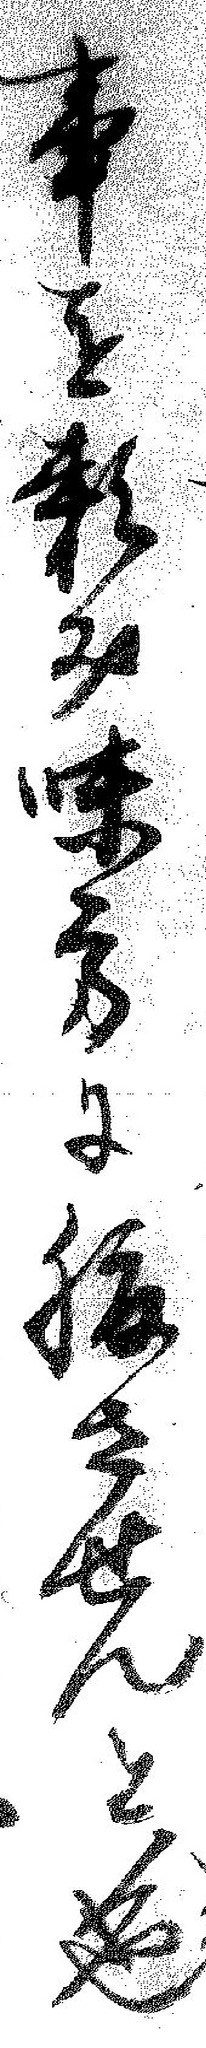事を頼み味方に腹させんと色
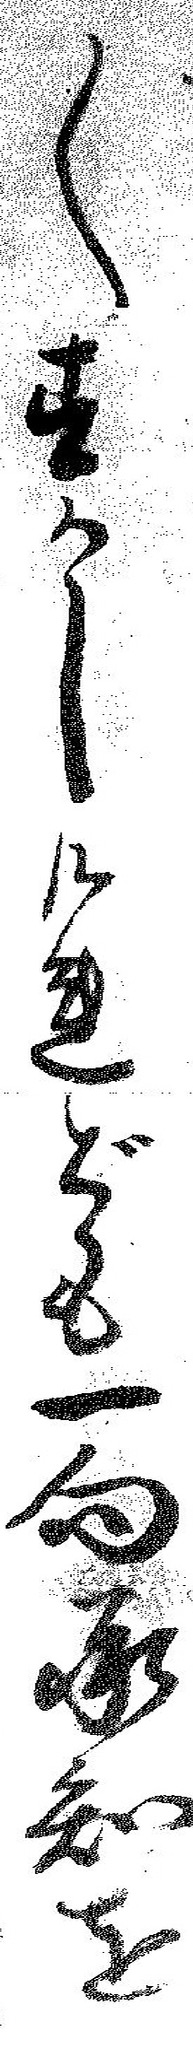〳〵すかしけれども一向承知を
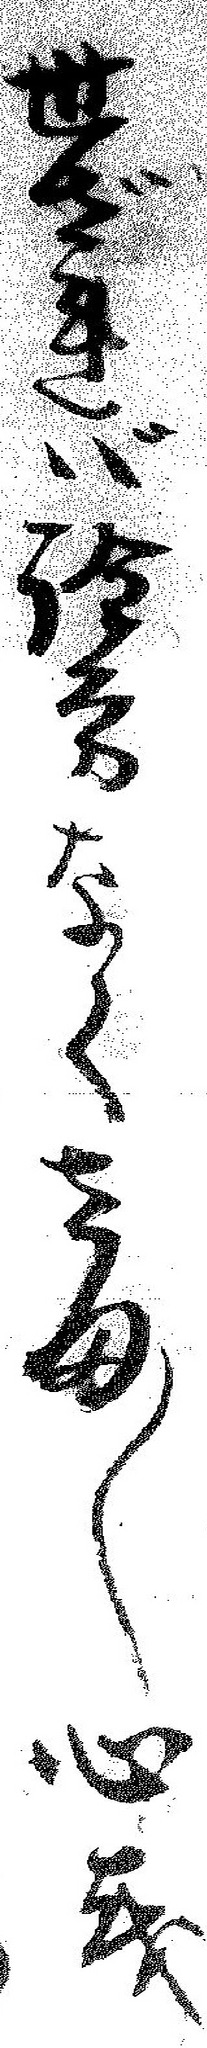せざれば詮方なくさま〳〵心義
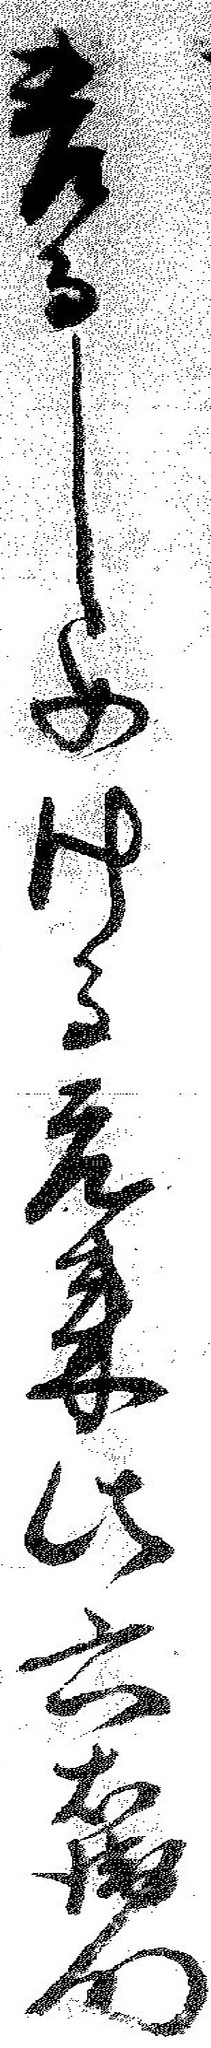苦るしめける元来此六右衛門
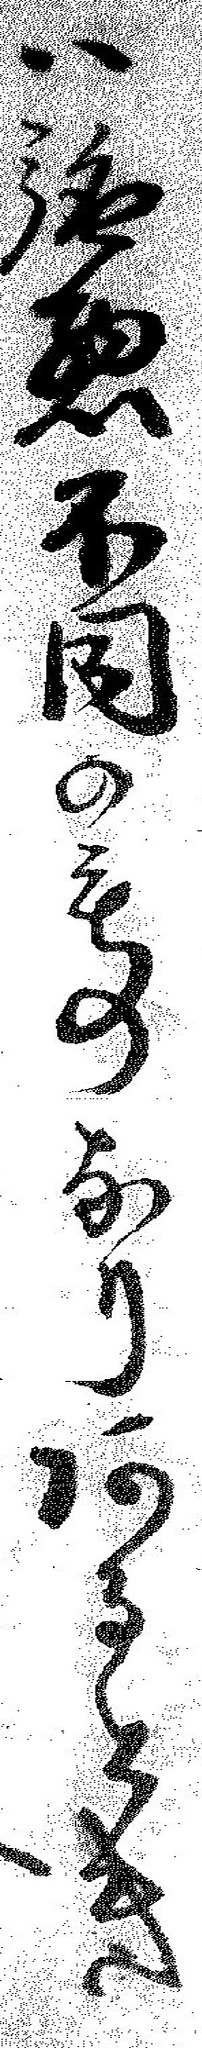は強悪不用のものなりあるとき
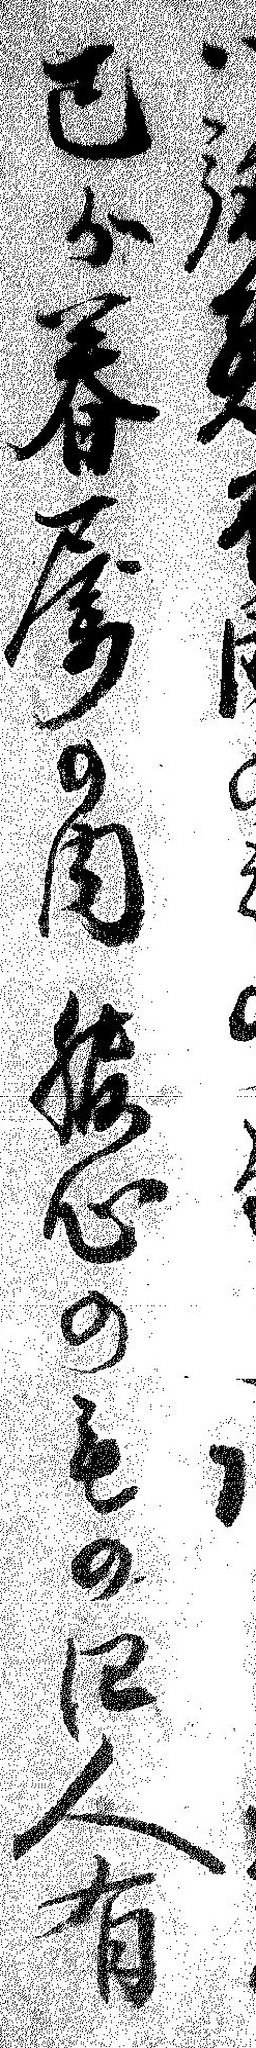己が眷属の内腹心のもの四人有

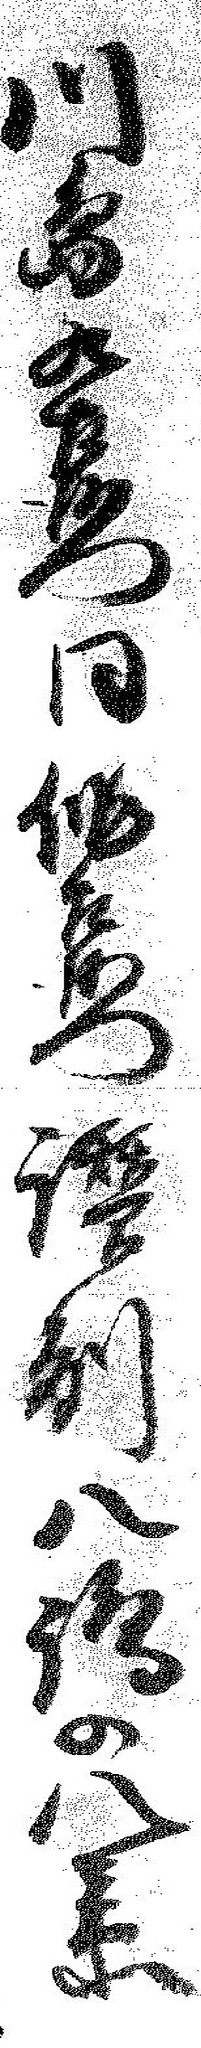川島九左衛門同作左衛門讃州八嶋の八兵衛
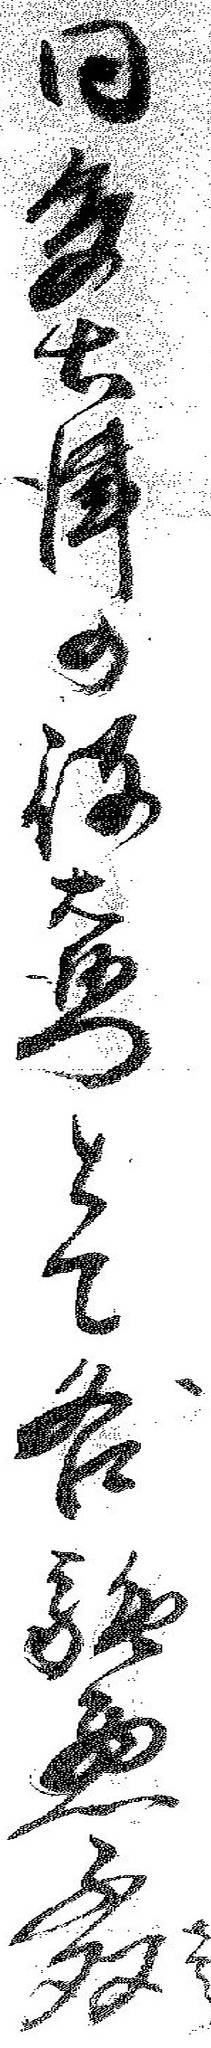同多土津の役右衛門とて各強悪不双
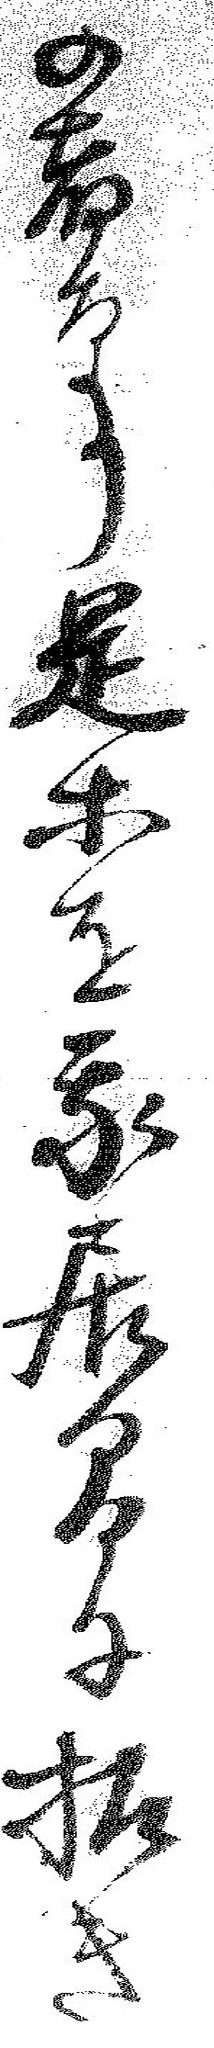の者なり是等を我居間に招き
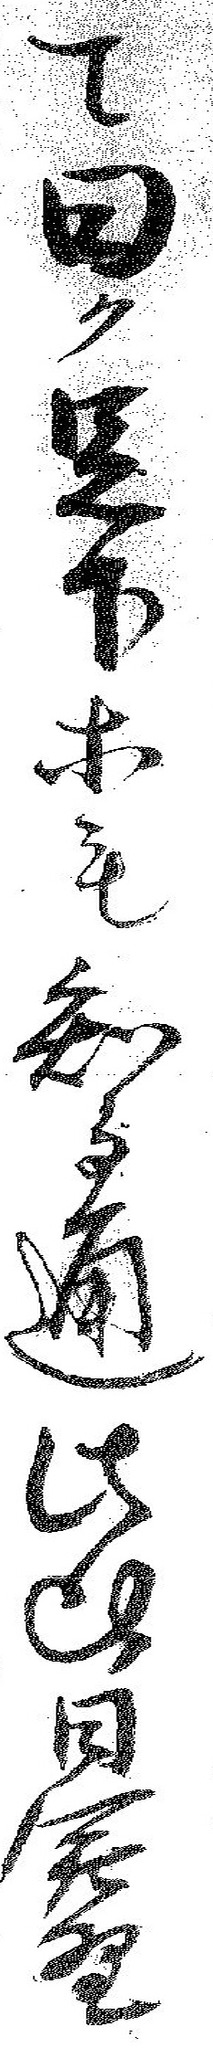て曰く足下等も知る通此頃日開野
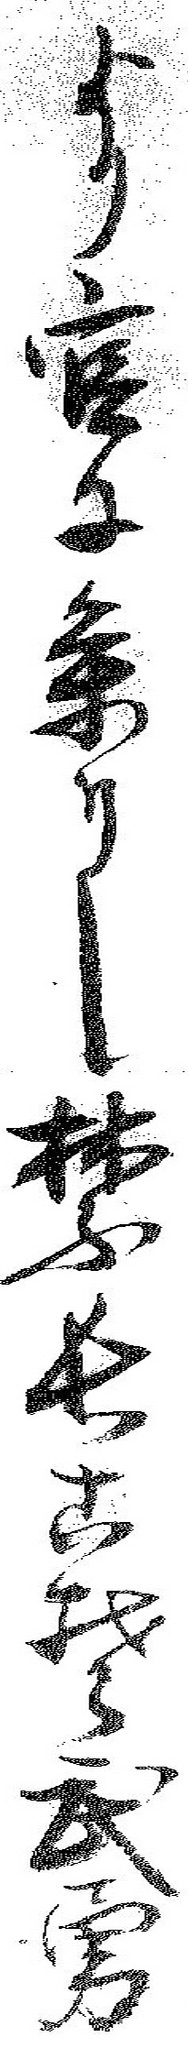より官に参りし禁長こそ武勇
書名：近頃古狸珍説　礼義智信
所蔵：徳島県立図書館
